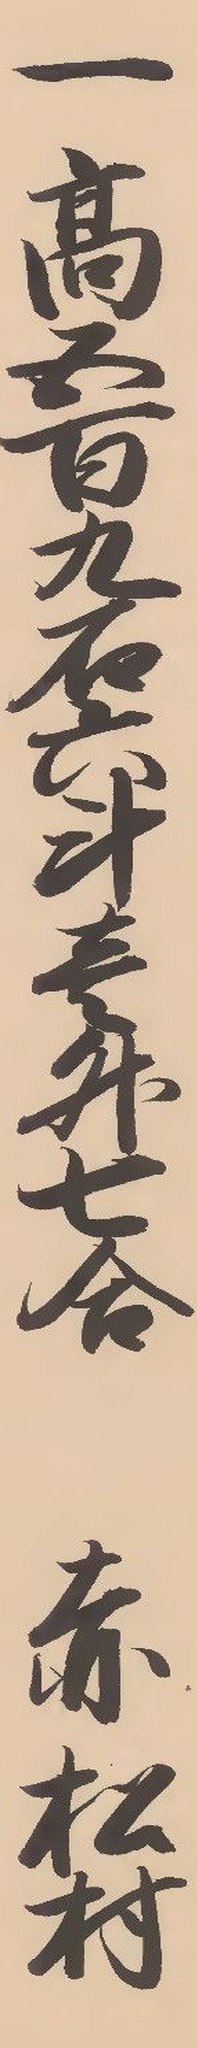一高五百九石六斗壱升七合赤松村
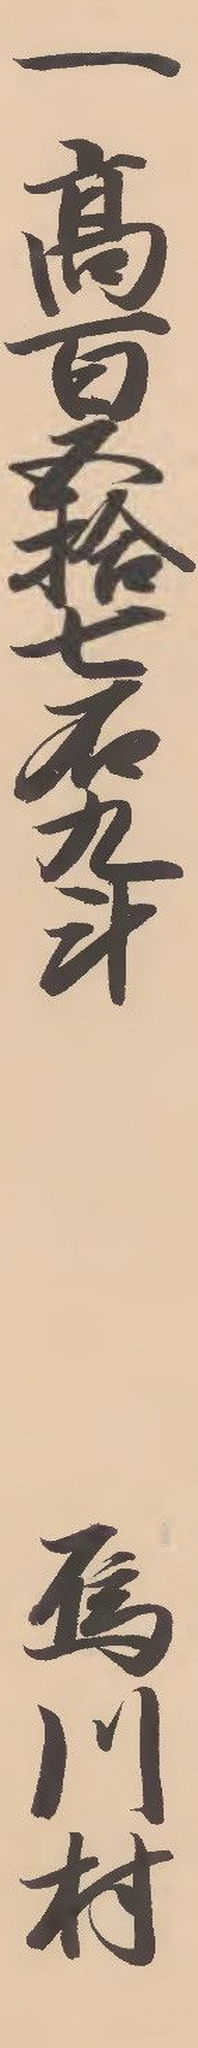一高百五拾七石九斗烏川村
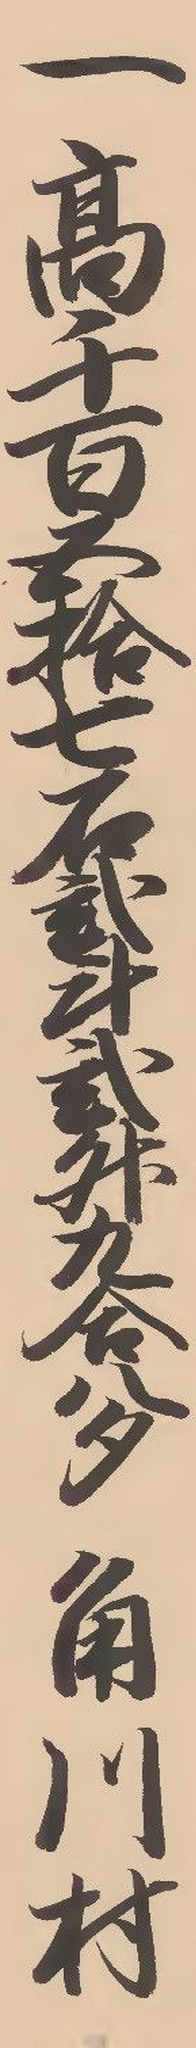一高千百五拾七石弐斗弐升九合八勺角川村
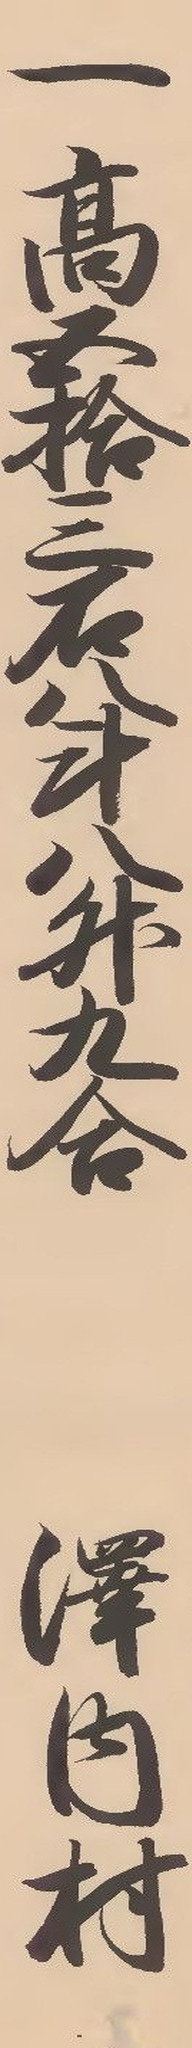一高五拾三石八斗八升九合沢内村
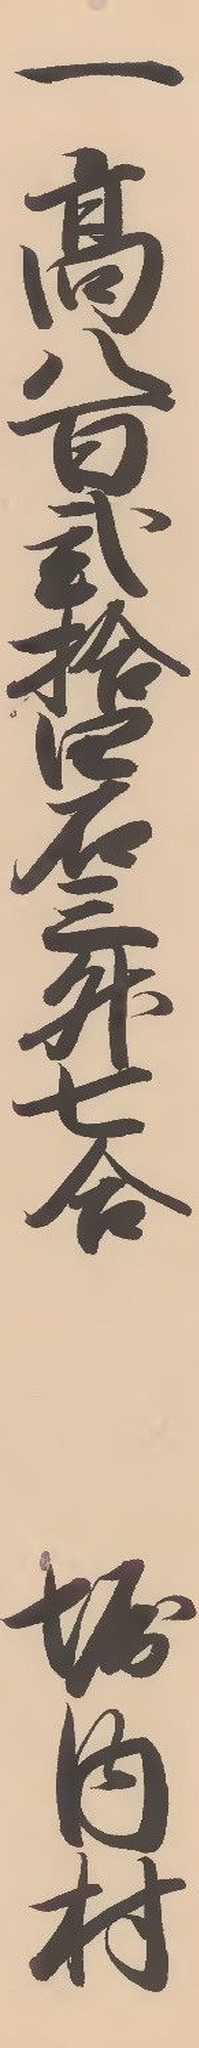一高八百弐拾四石三升七合堀内村
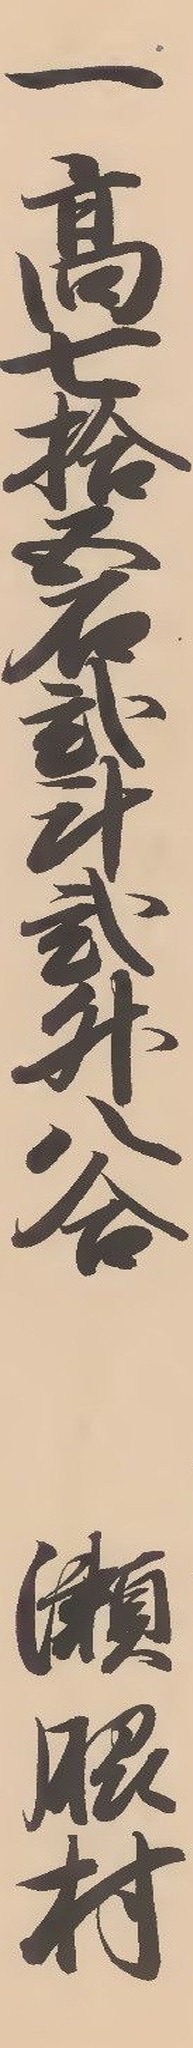一高七拾五石弐斗弐升八合瀬脇村
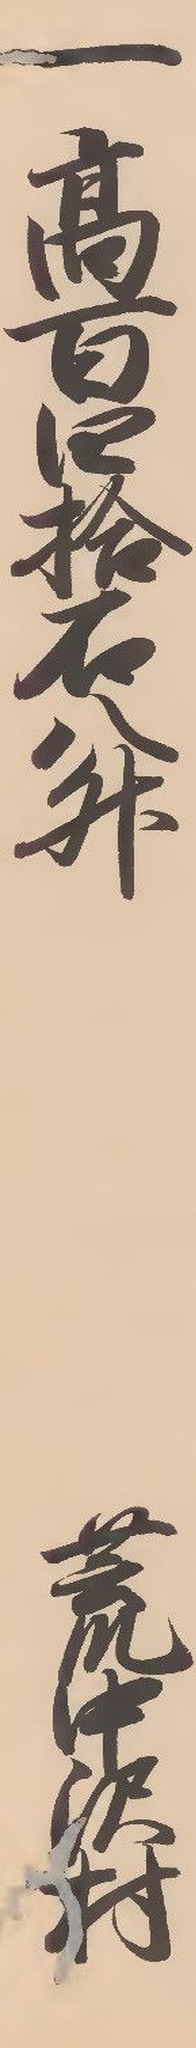一高百四拾石八升荒中沢村

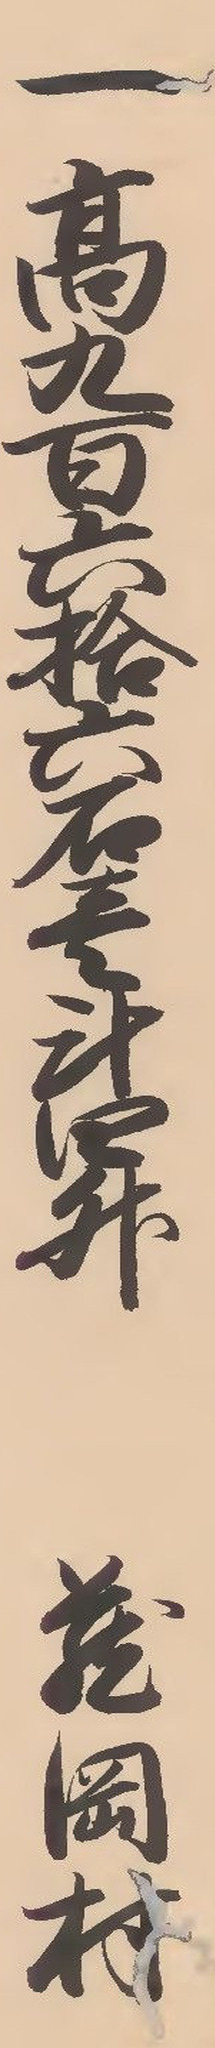一高九百六拾六石壱斗四升花岡村
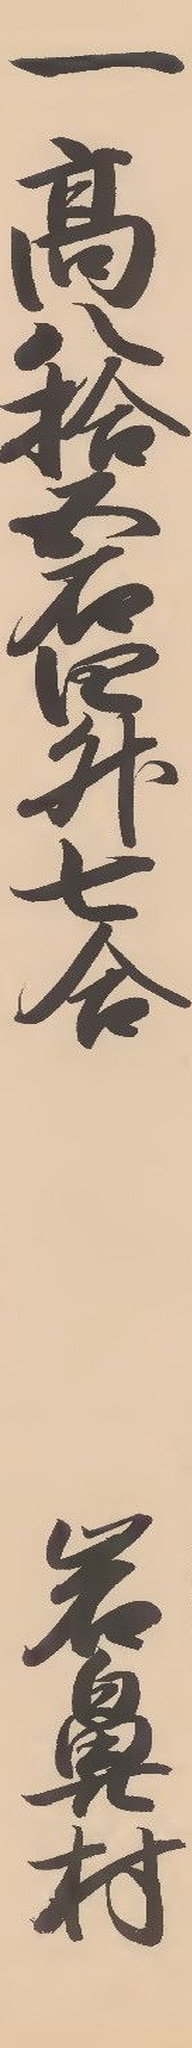一高八拾五石四升七合岩鼻村
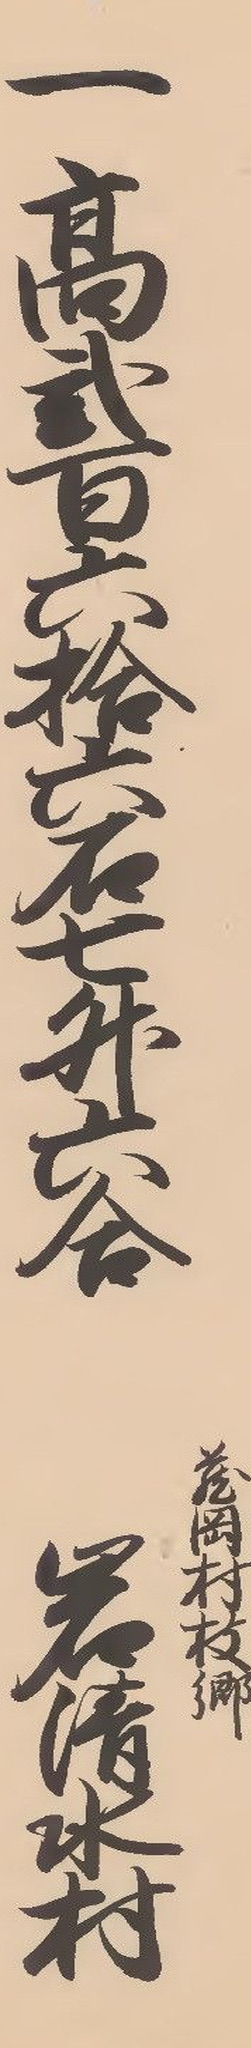一高弐百六拾六石七升六合岩清水村
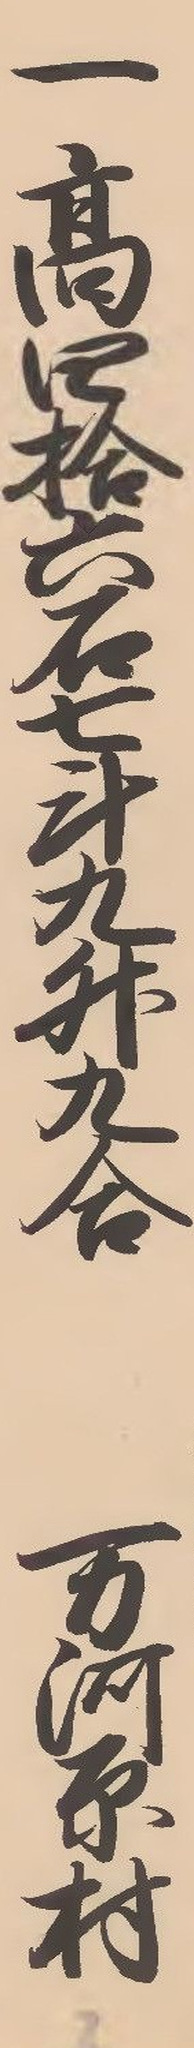一高四拾六石七斗九升九合万河原村
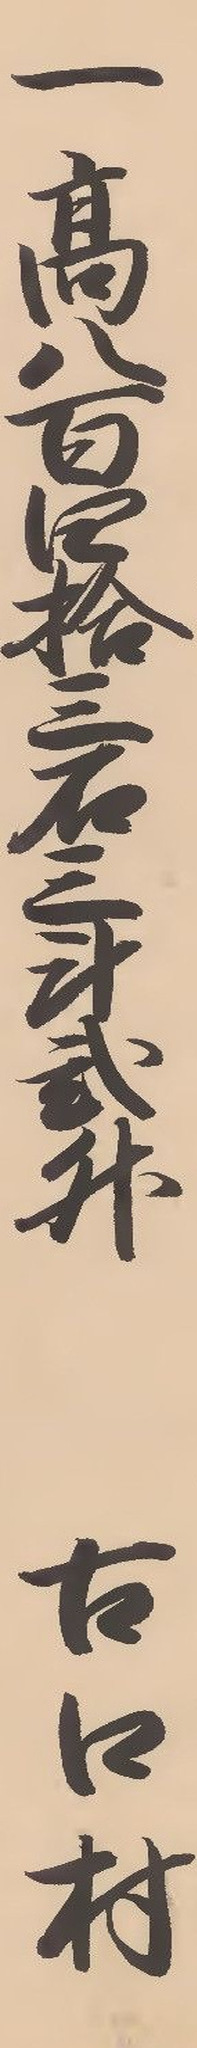一高八百四拾三石三斗弐升古口村
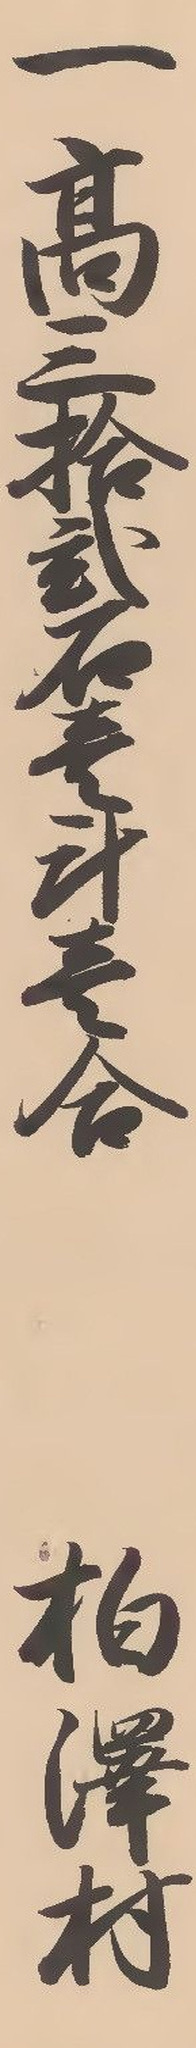一高三拾弐石壱斗壱合柏沢村
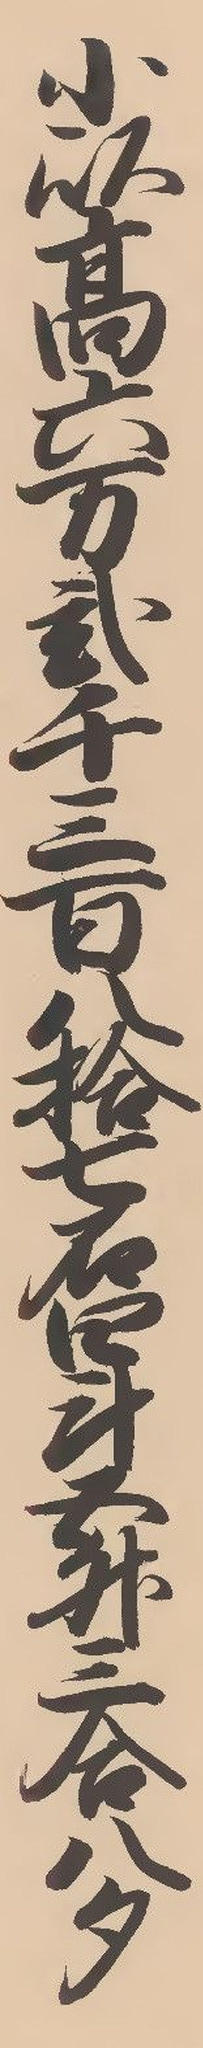小以高六万弐千三百八拾七石四斗五升三合八勺
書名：出羽国郷帳　３
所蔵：国立公文書館 National Archives of Japan
